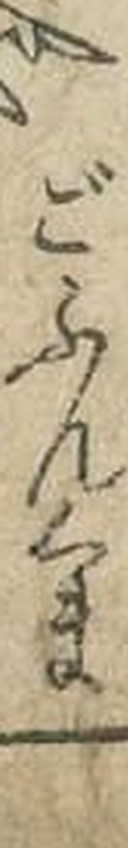ごふんくま
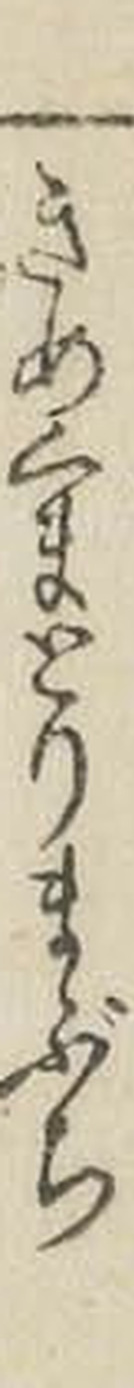きめくまとりまぶち
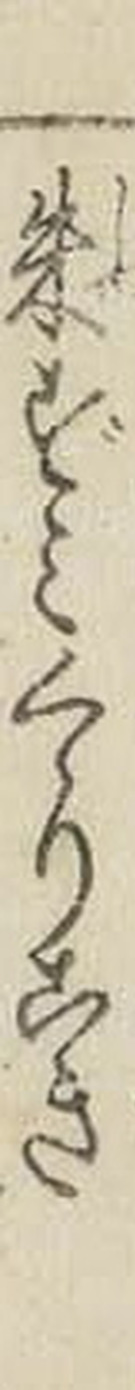朱ずみくゝりこき
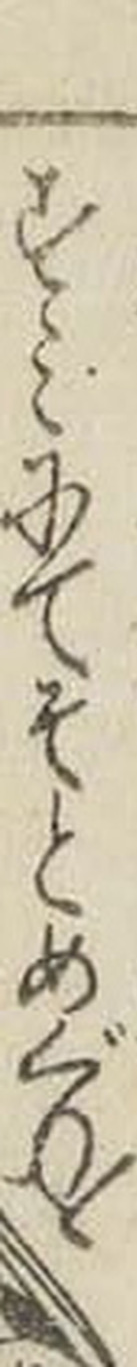すみにてそとめぐりを
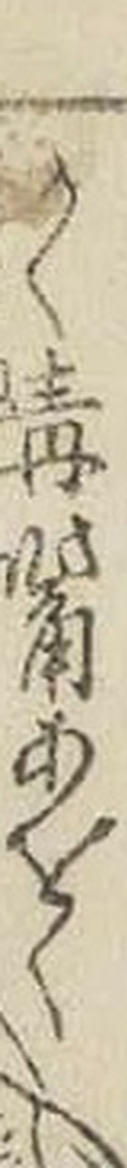かく青嘴あをく
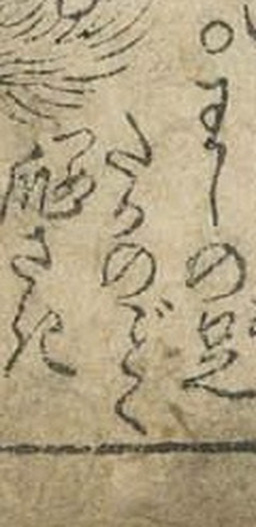たかのごとく
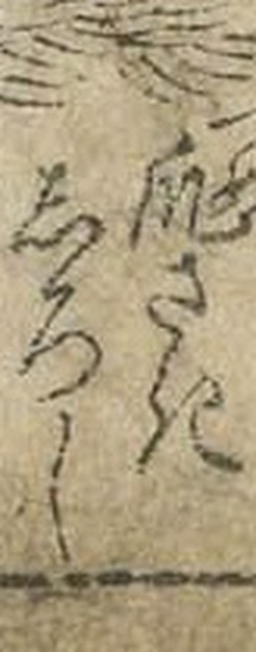しろし
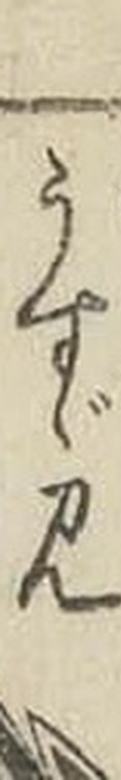うすゞみ
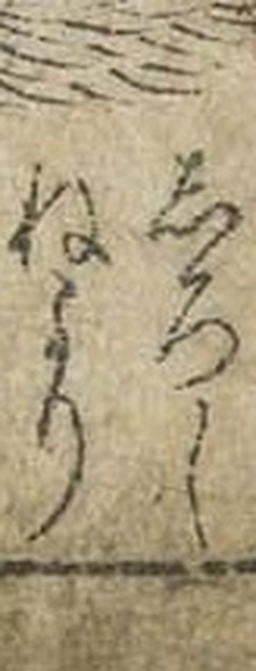ねより
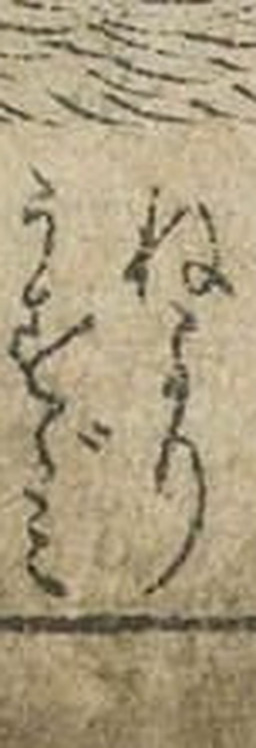うすゞみ
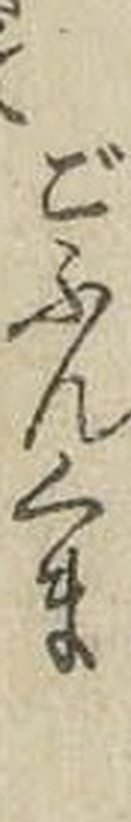ごふんくま
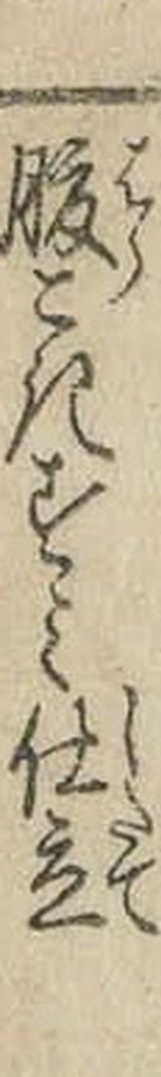腹こきすみ仕立
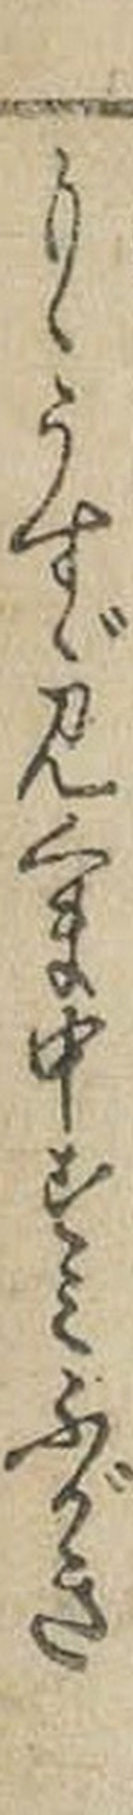もゝうすゞみくま中すみふがき
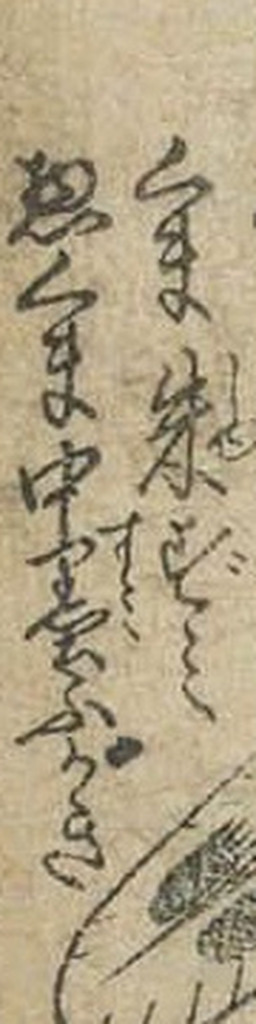総くま中墨ふがき

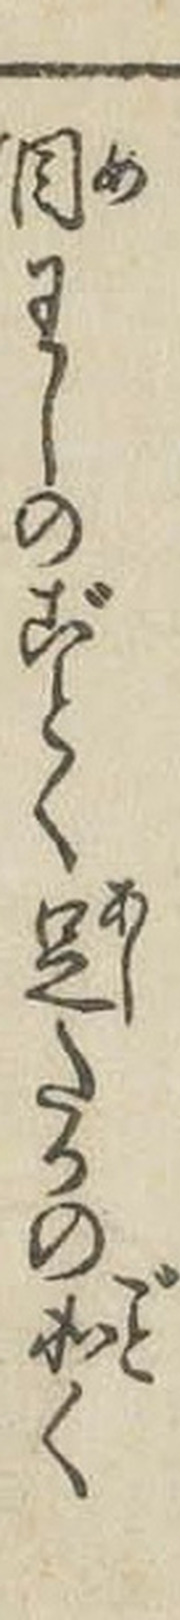目わしのごとく足たかの如く
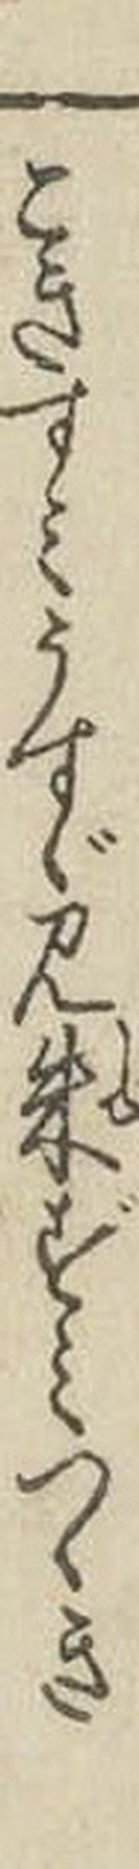こきすみうすゞみ朱ずみつゝき
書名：絵本写宝袋 9巻 8之巻
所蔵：東京学芸大学教育コンテンツアーカイブ
